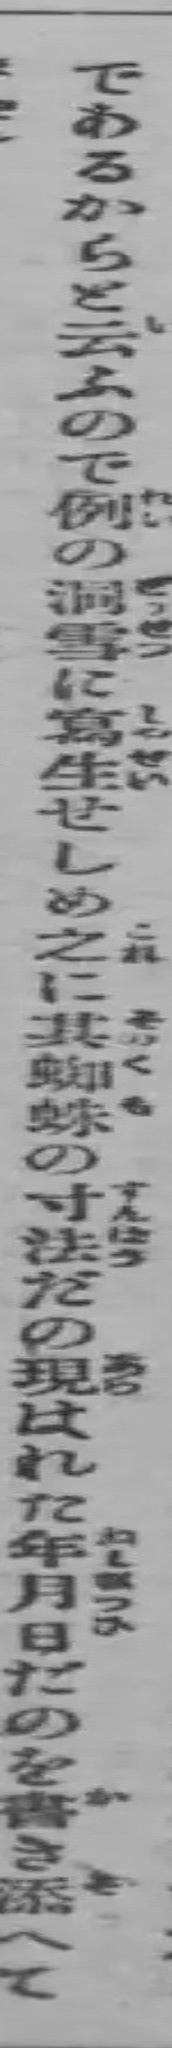であるからと云ふので例の洞雪に写生せしめ之に其蜘蛛の寸法だの現はれた年月日だのを書き添へて
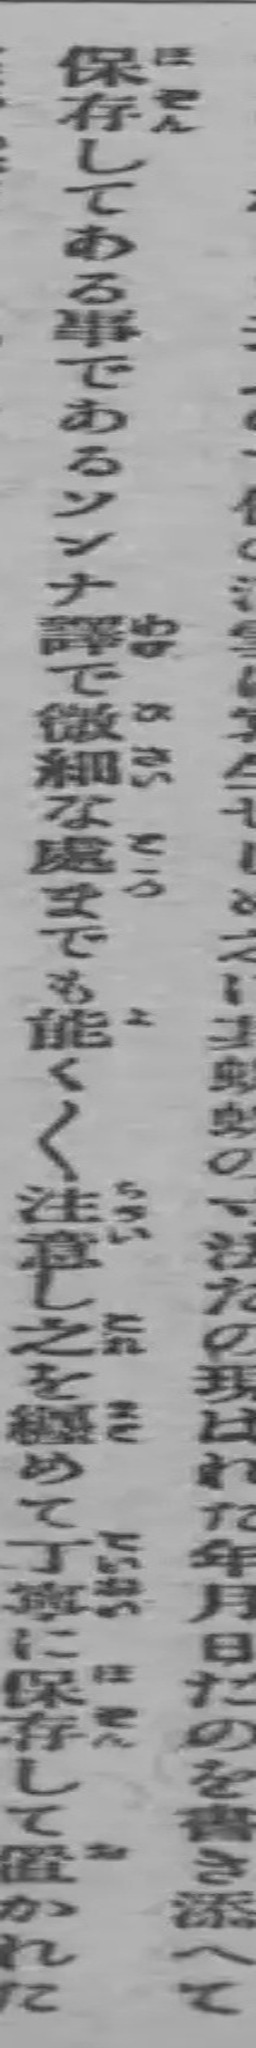保存してある事であるソンナ訳で微細な処までも能く〳〵注意し之を纏めて丁寧に保存して置かれた
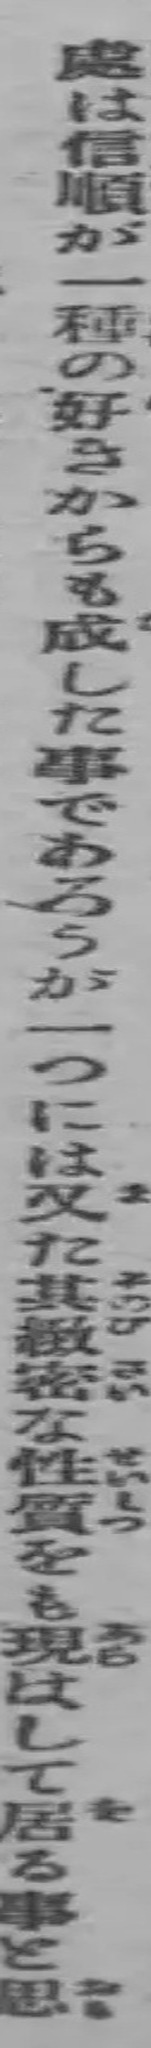処は信順が一種の好きからも成した事であろうが一つには又た其微蜜な性質をも現はして居る事と思
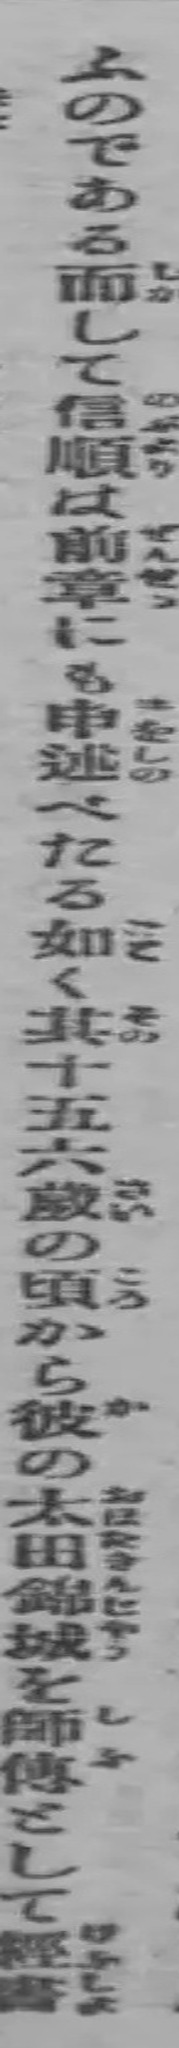ふのである而して信順は前章にも申述べたる如く其十五六歳の頃から彼の太田錦城を師傅として経書
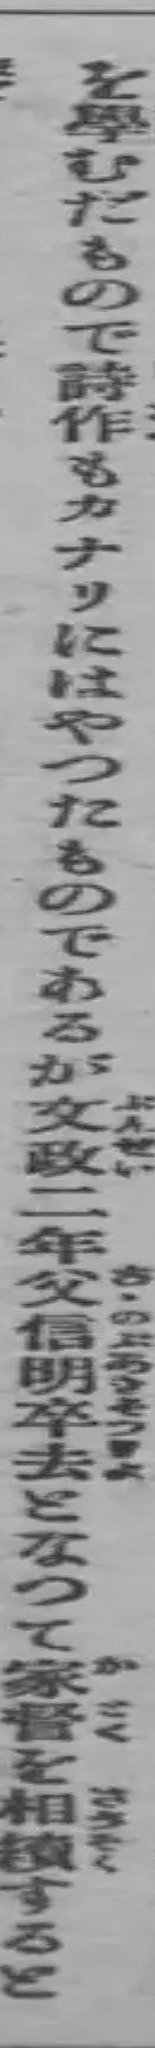を学むだもので詩作もカナリにはやつたものであるが文政二年父信明卒去となつて家督を相続すると
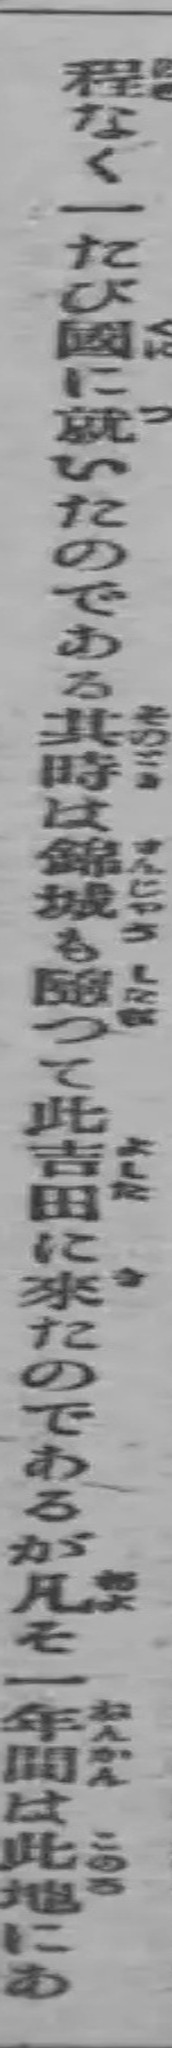程なく一たび国に就いたのである其時は錦城も随つて此吉田に来たのであるが凡そ一年間は此地にあ
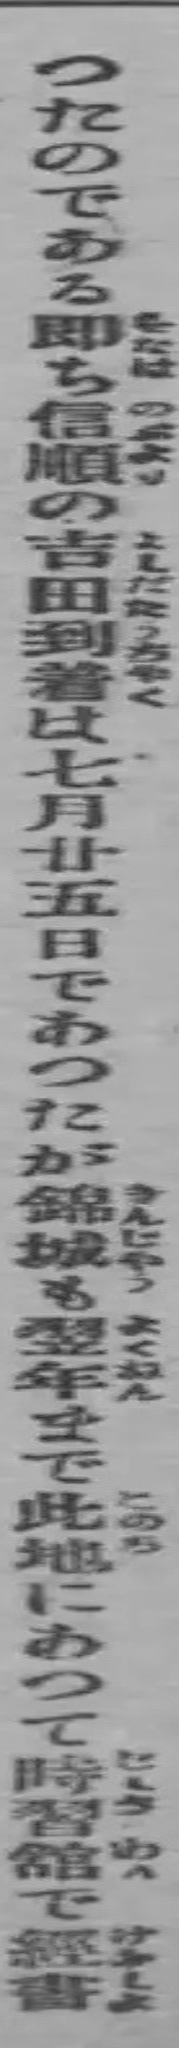つたのである即ち信順の吉田到着は七月廿五日であつたが錦城も翌年まで此地にあつて時習館で経書
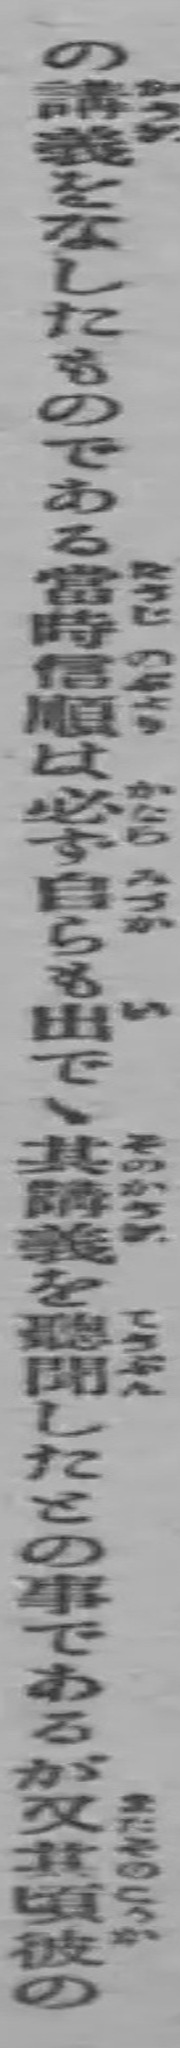中山美石の講義をなしたものである当時信順は必ず自らも出でゝ其講義を聴聞したとの事であるが又其頃彼の
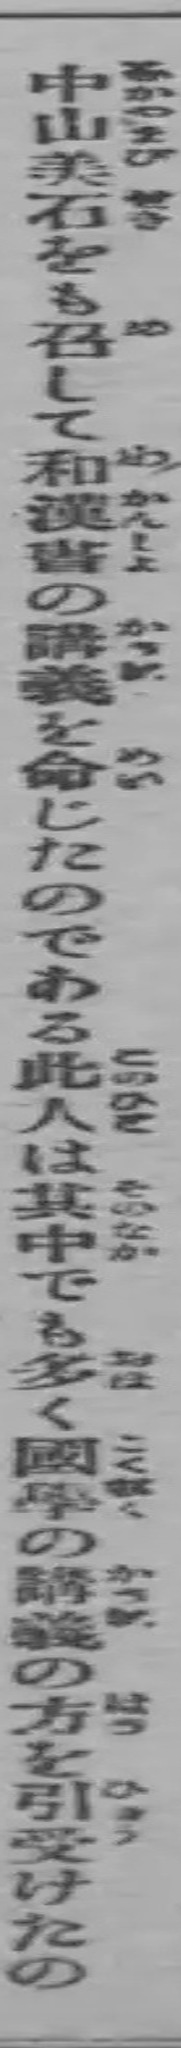中山美石をも召して和漢書の講義を命じたのである此人は其中でも多く国學の講義の方を引受けたの
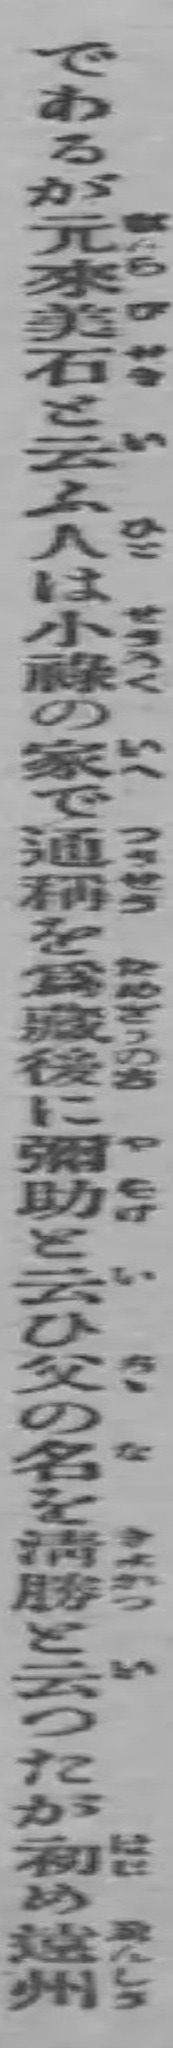であるが元来美石と云ふ人は小禄の家で通称を爲蔵後に彌助と云ひ父の名を清勝と云つたが初め遠州
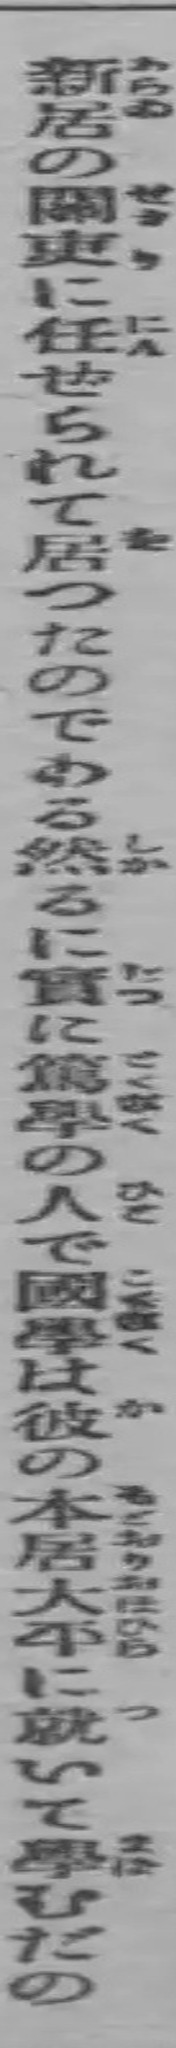新居の関吏に任ぜられて居つたのである然るに実に篤学の人で国学は彼の本居大平に就いて学むだの
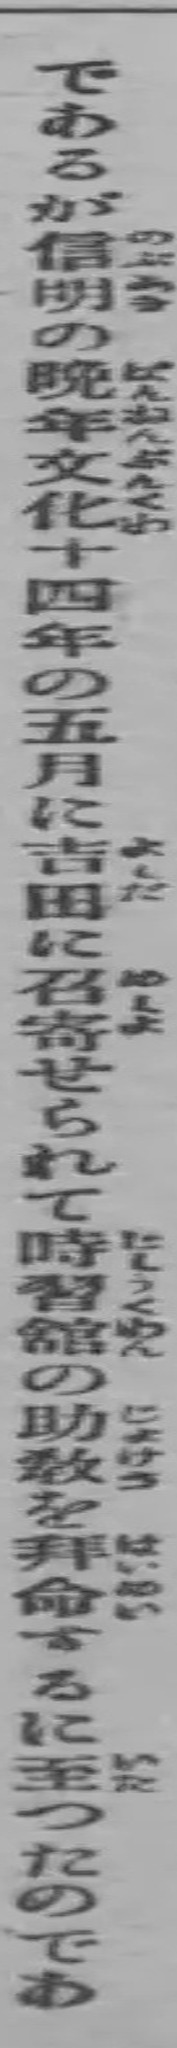であるが信明の晩年文化十四年の五月に吉田に召寄せられて時習館の助教を拝命するに至つたのであ
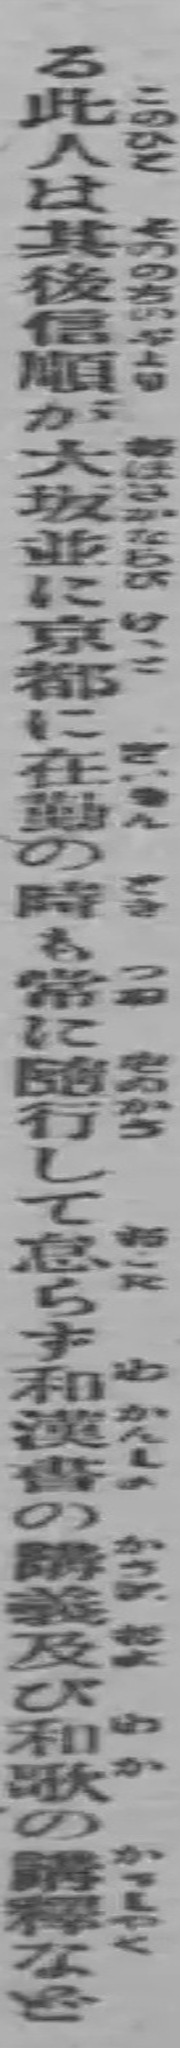る此人は其後信順が大坂並に京都に在勤の時も常に随行して怠らず和漢書の講義及び和歌の講釈など
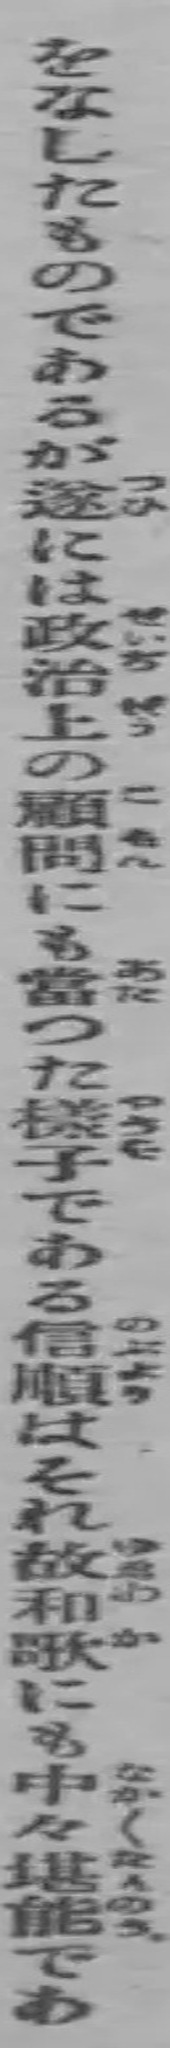をなしたものであるが遂には政治上の顧問にも当つた様子である信順はそれ故和歌にも中々堪能であ
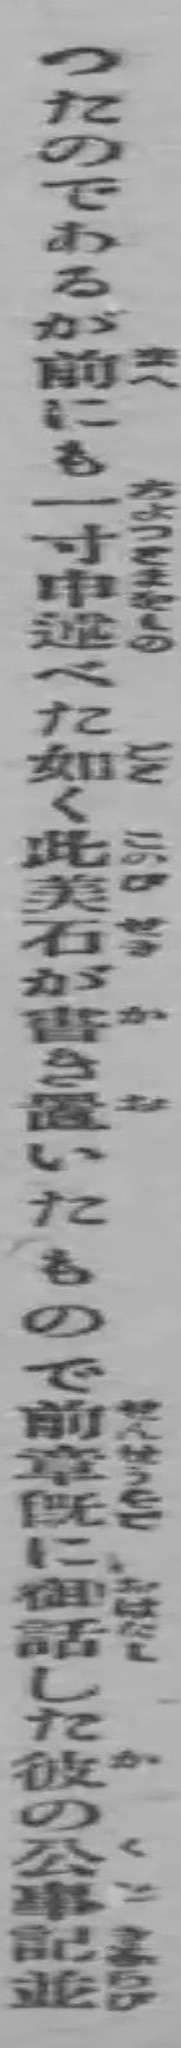公事記つたのであるが前にも一寸申述べた如く此美石が書き置いたもので前章既に御話した彼の公事記並
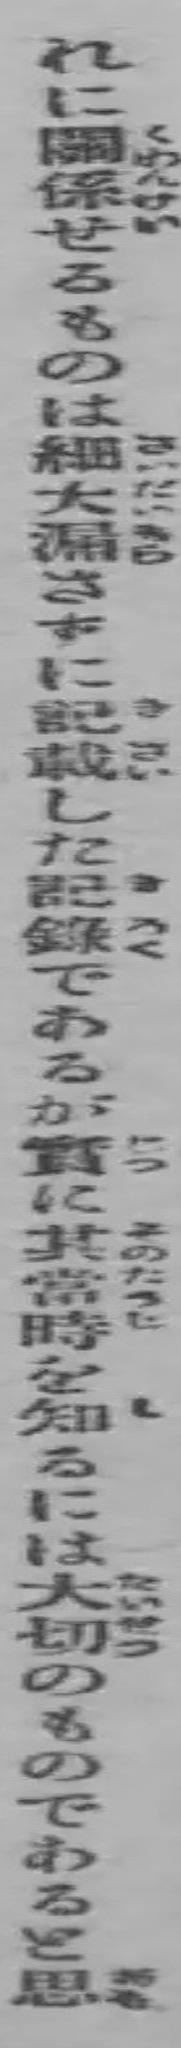れに関係せるものは細大漏さずに記載した記録であるが実に其当時を知るには大切のものであると思
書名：豊橋市史談
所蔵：国立国会図書館 National Diet Library, JAPAN
